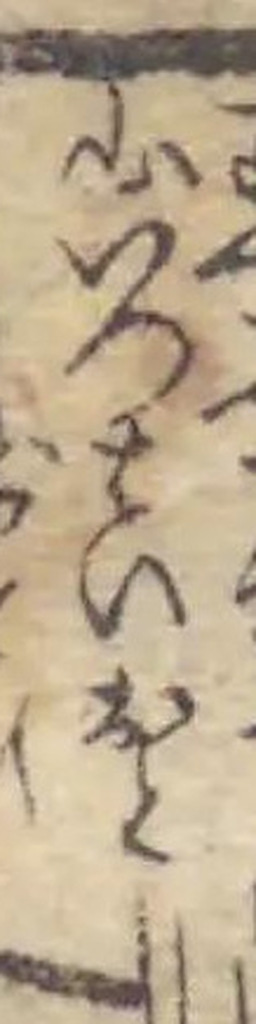山いつはいおと
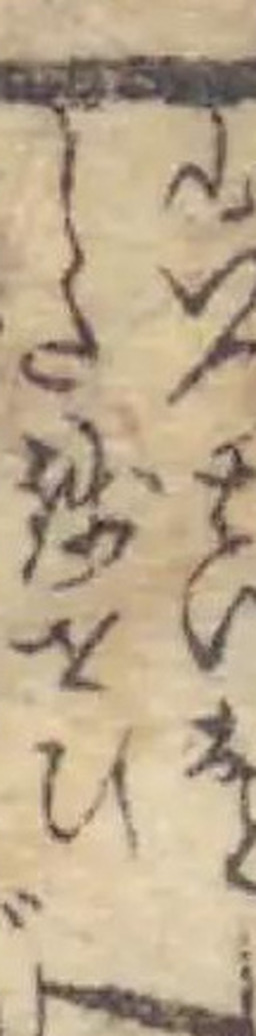した銭をひ
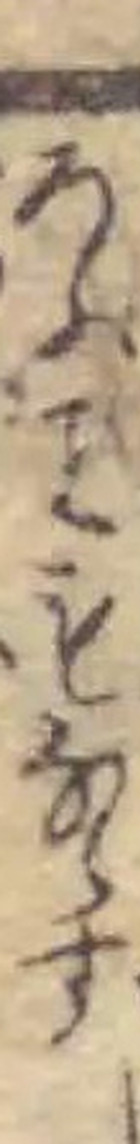ろふこともならず
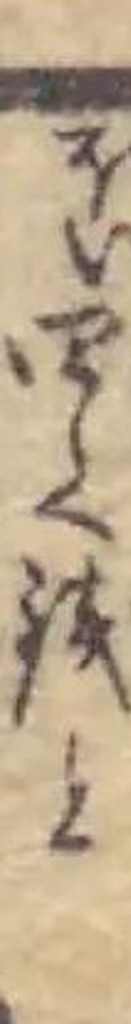ほい四文銭と
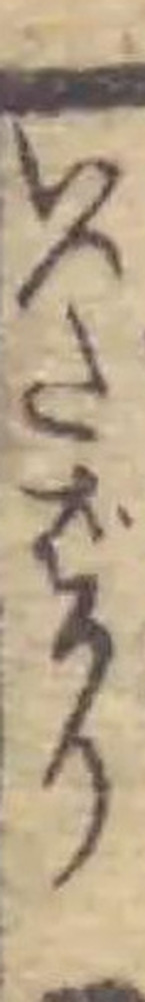いつたばかり
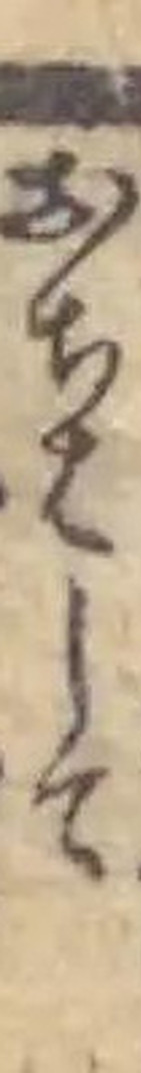おちはして
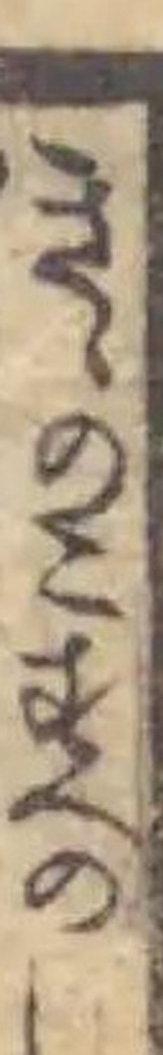きゝのこすへの
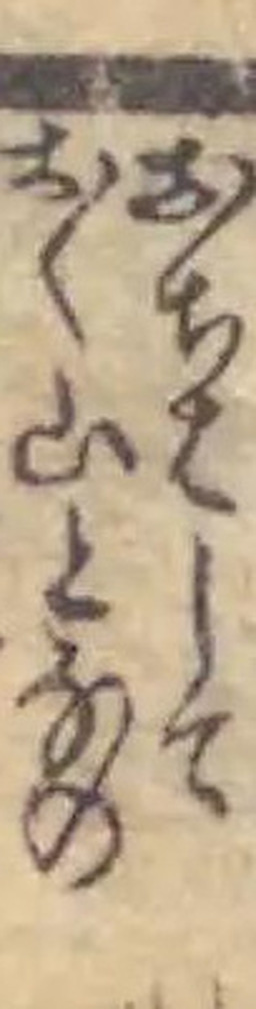おく山となの
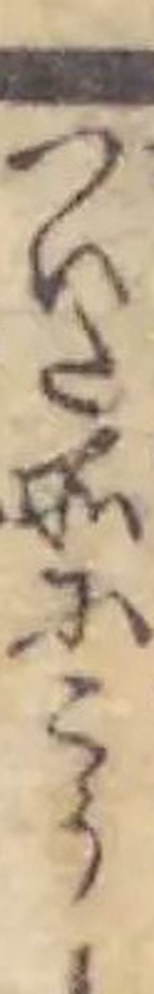ついた所にこう
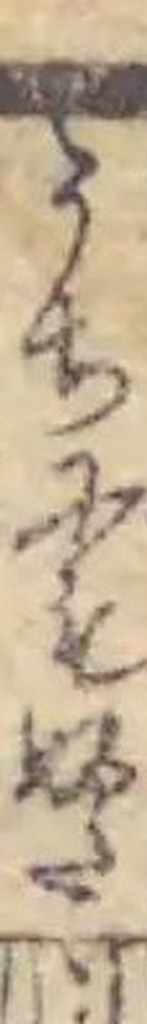うちにもふた
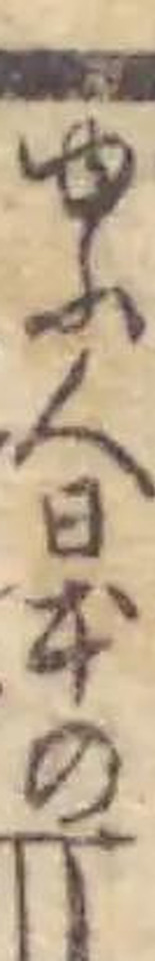ゆふ人日本の
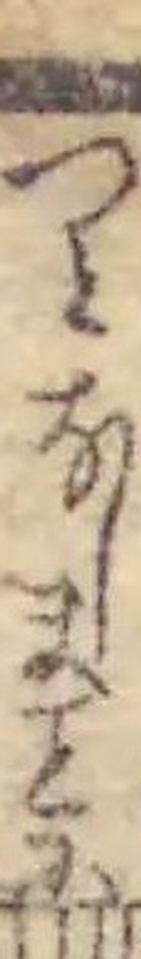つとなしまことに
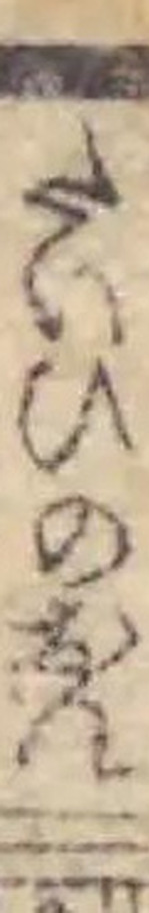たいひのおん
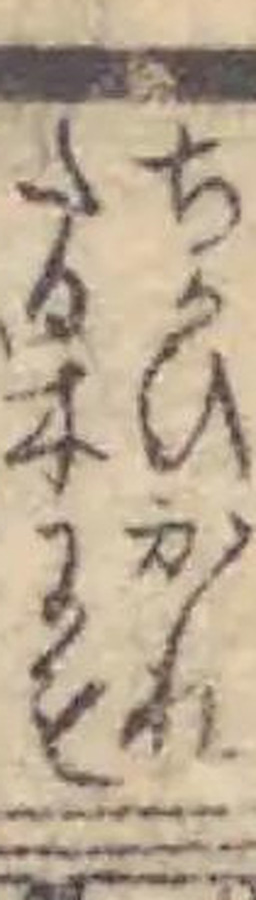たる木にも
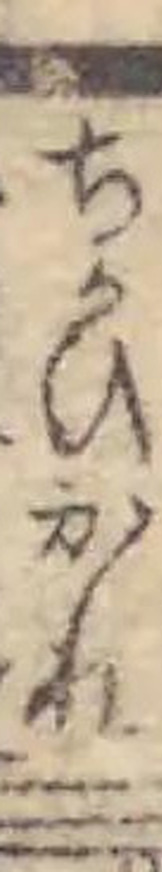ちかひかれ
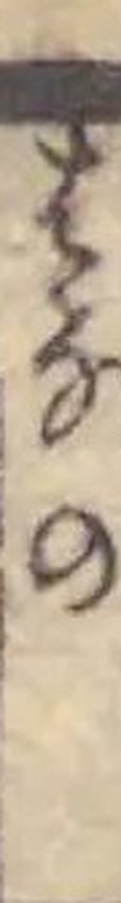はなの
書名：豆男江戸見物 2巻
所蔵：国立国会図書館 National Diet Library, JAPAN
